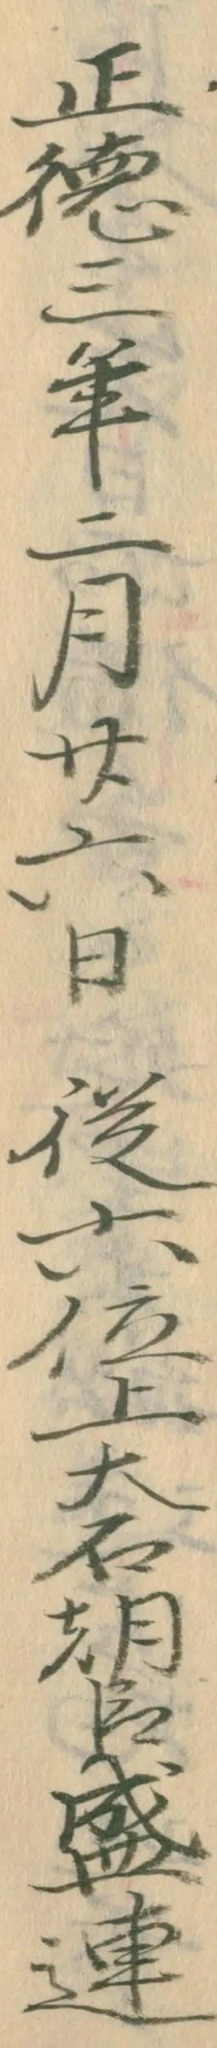正徳三年二月廿六日従六位上大石朝臣盛連

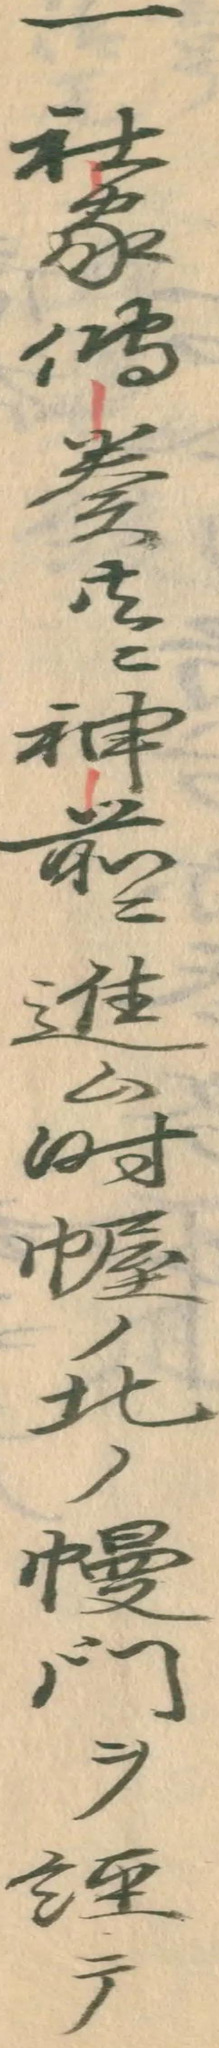一社-家伝-奏共ニ神-前ニ進ム時幄ノ北ノ慢門ヲ経テ
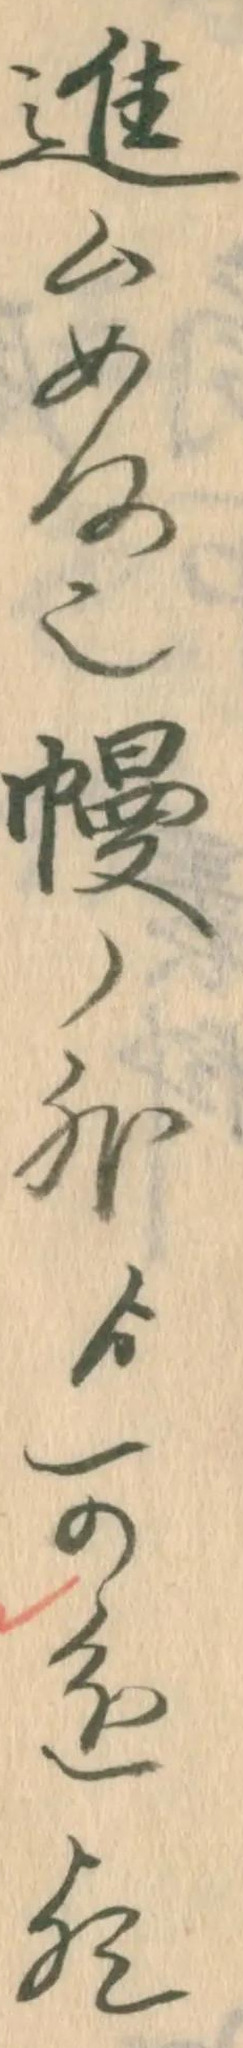進ム如何也慢ノ外ゟ可進歟
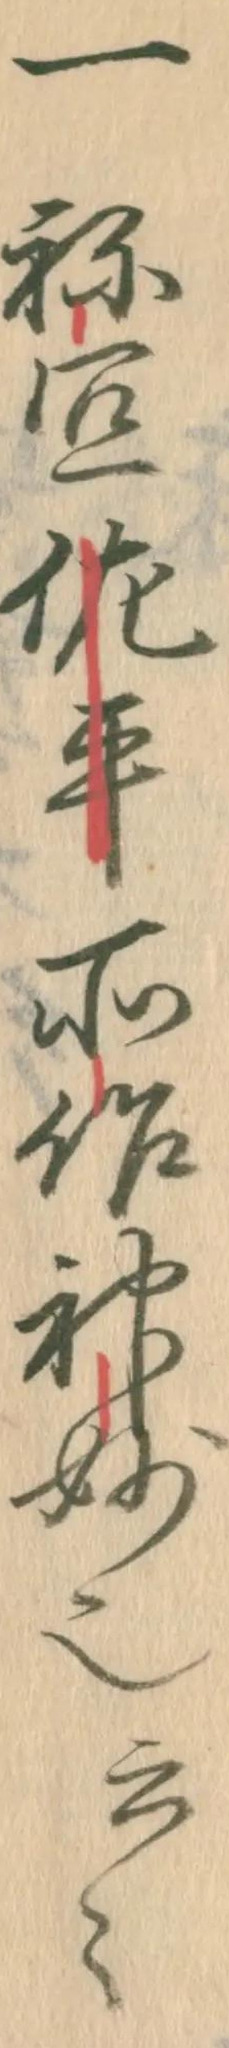一祢-宜佐平所-作神-妙也云々
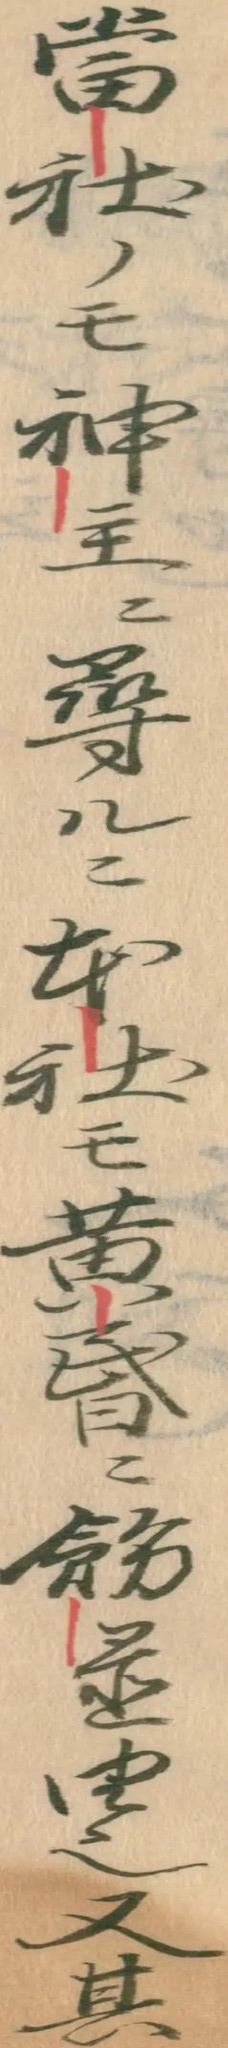当-社ノモ神_主ニ尋ルニ本-社モ黄-昏ニ飾_置由也又其
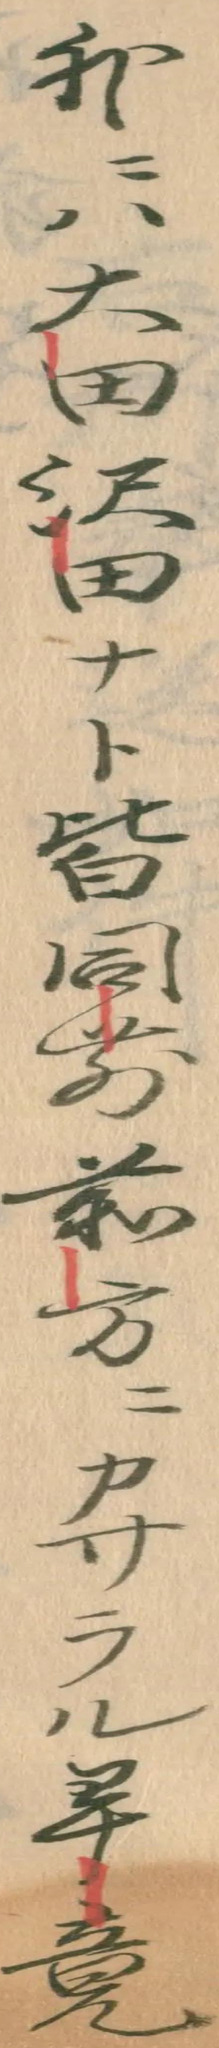外ニハ大_田沢_田ナト皆同-前前_方ニカサラル畢-竟
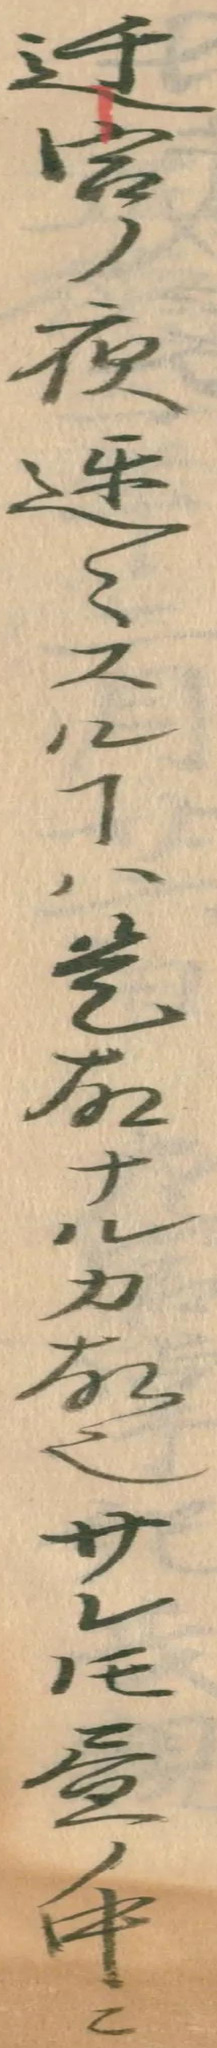迁-宮ノ夜遅々スルコトハ是故ナルカ故也サレトモ昼ノ中ニ
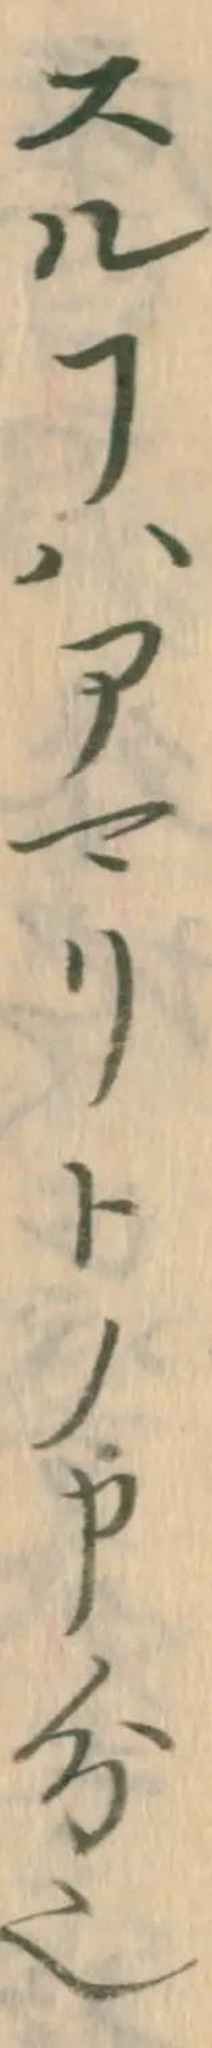スルコトハアマリトノ申分也
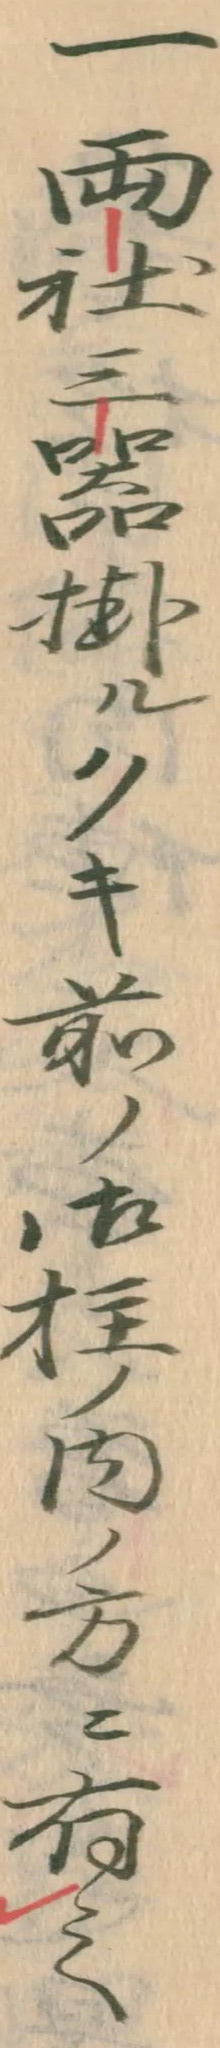一両-社三-器掛ルクキ前ノ御柱ノ内ノ方ニ有之
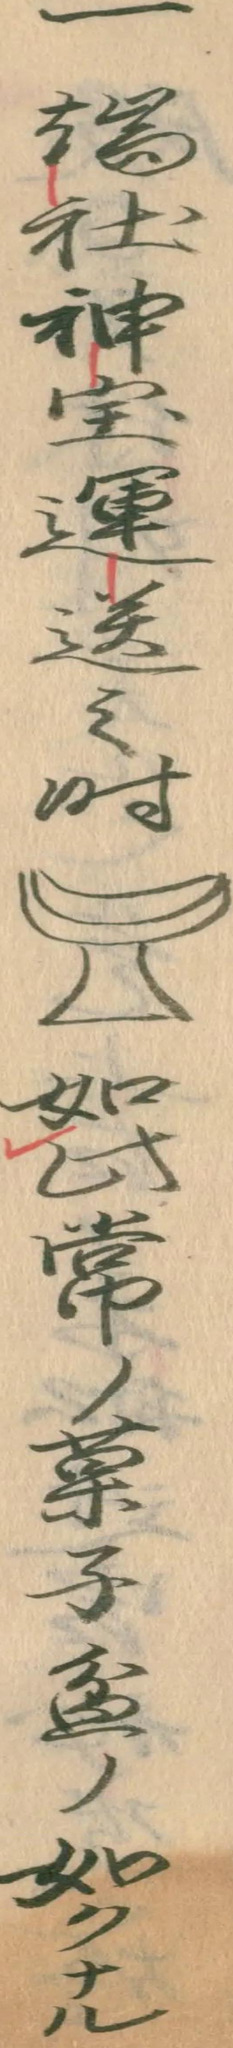一端_社神-宝運-送之時如此常ノ菓子盆ノ如クナル
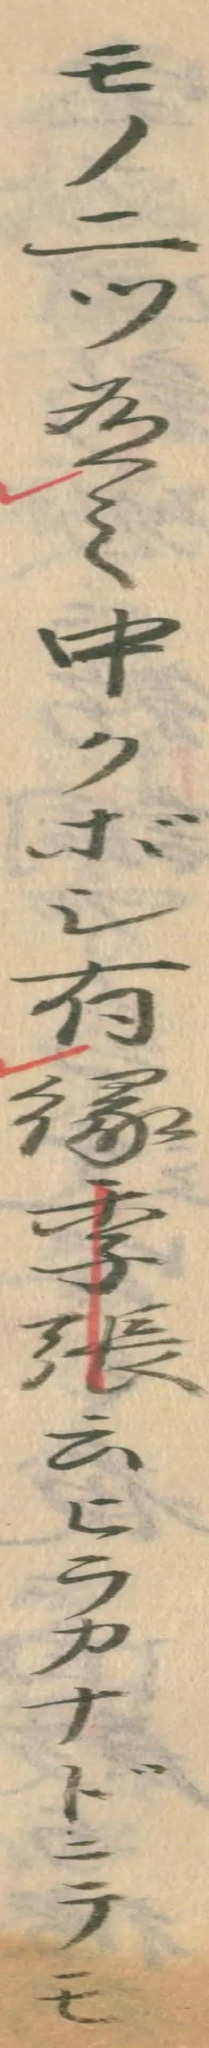モノ二ツ有之中クボシ有縁季張云ヒラカナドニテモ
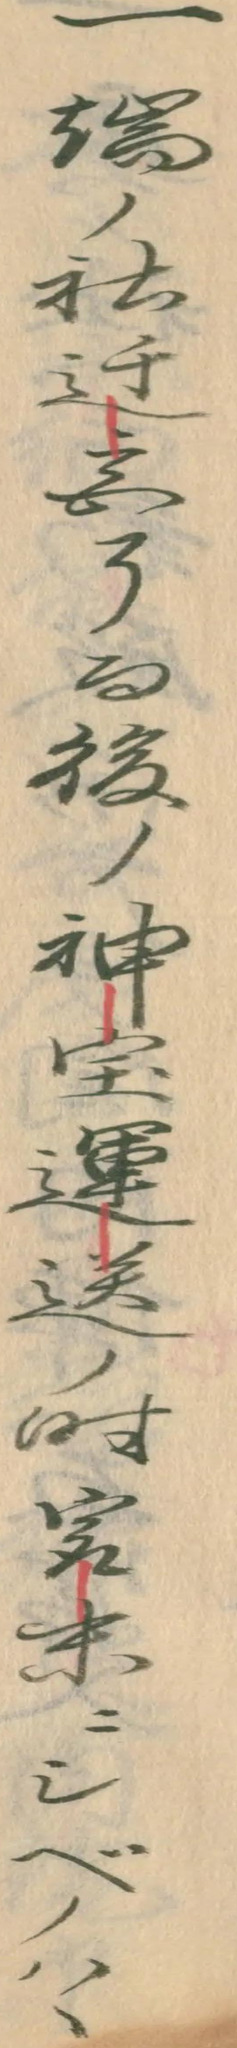一端ノ社迁-宮了而後ノ神-宝運-送ノ時最-末ニシベノハヽ
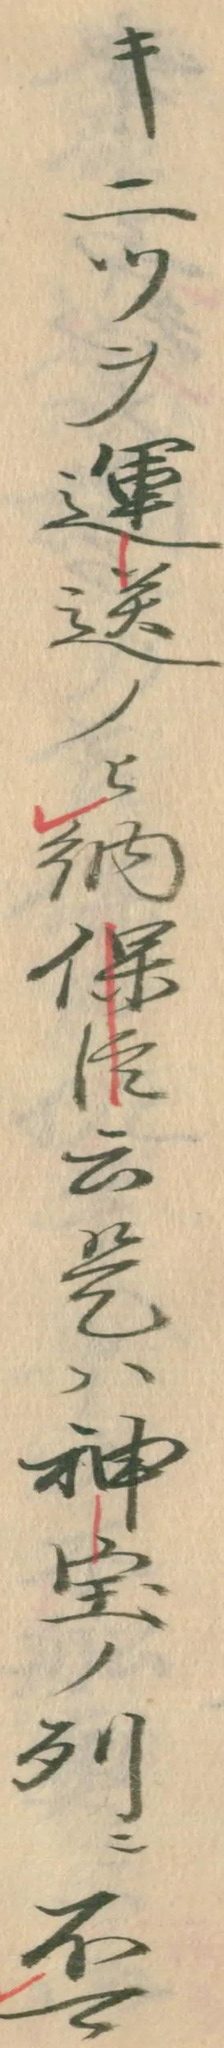キ二ツヲ運-送ノ被納保臣云是ハ神-宝ノ列ニ不可
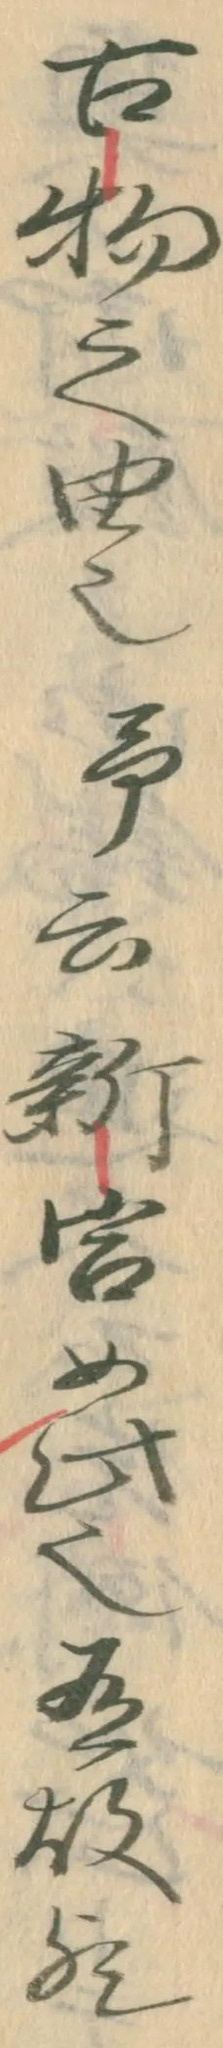古-物之由也予云新-宮如此也有故歟

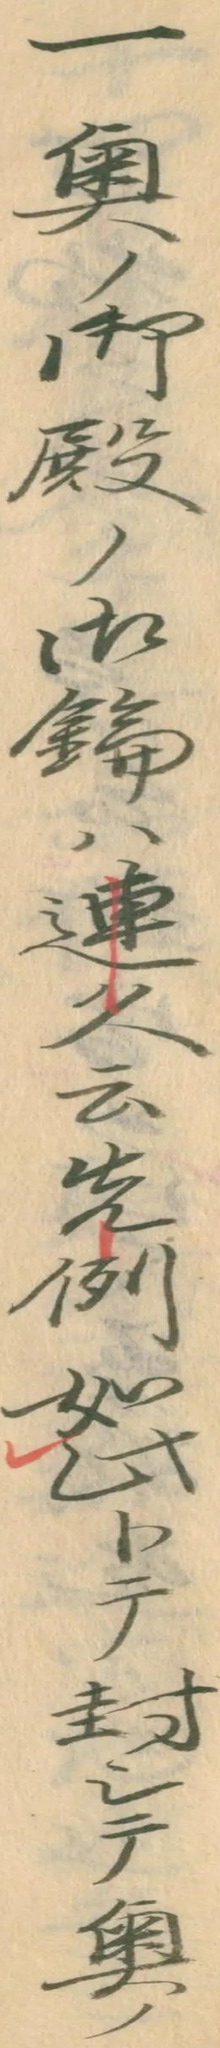一奥ノ御殿ノ御鑰ハ連久云先-例如此トテ封シテ奥ノ
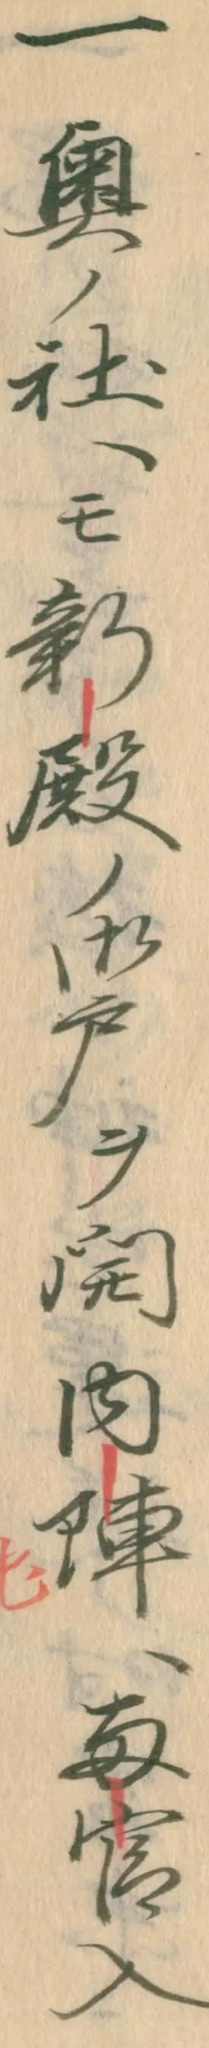一奥ノ社へモ新-殿ノ御戸ヲ開内-陣へ両-官入
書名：賀茂社記録. 第16冊
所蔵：国立国会図書館 National Diet Library, JAPAN
